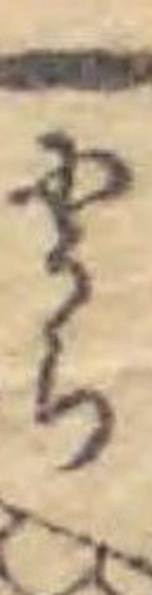にうち
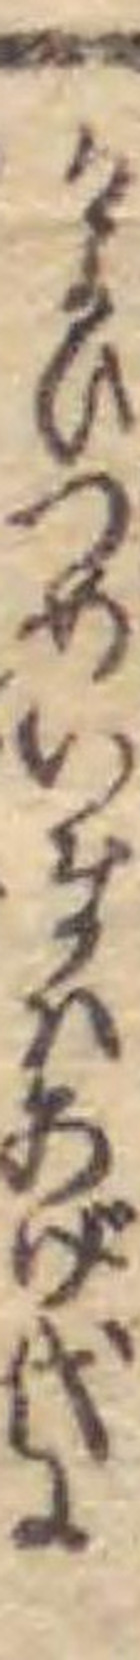かよひつめいまはあげ代に
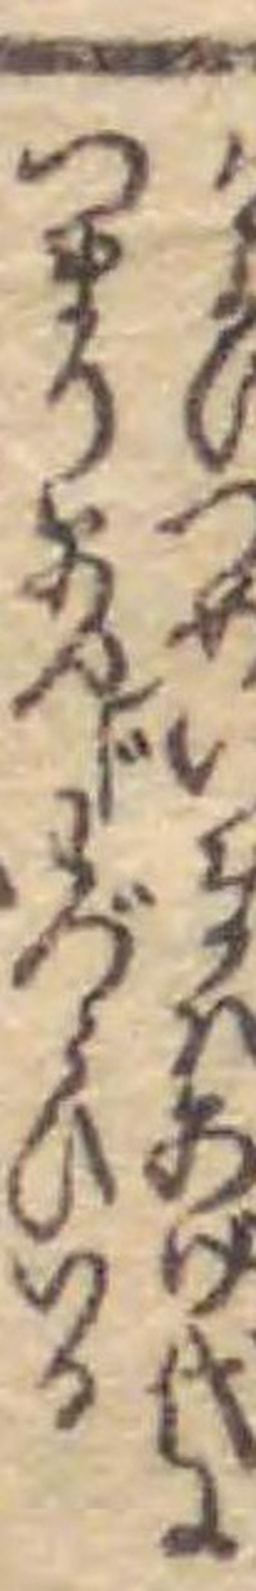つまりあんじわづらひいる
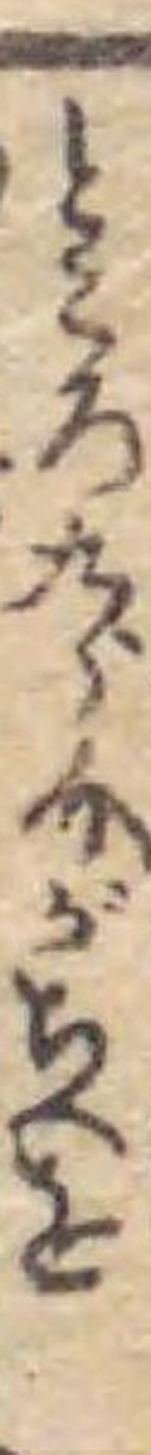ところ九郎介がちへを
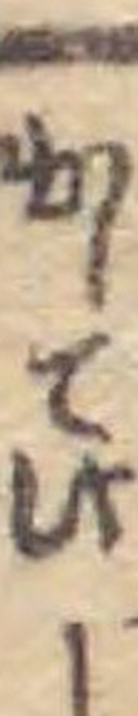出して此
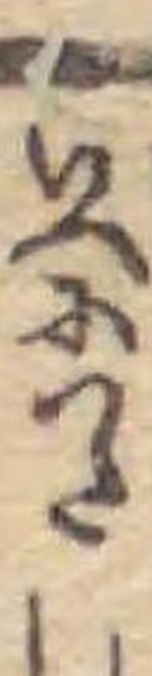いへにつた
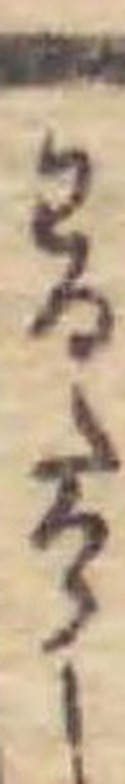わるたから
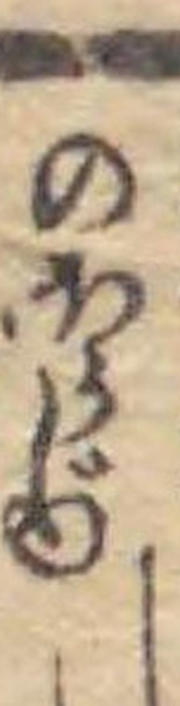のほうじゆ
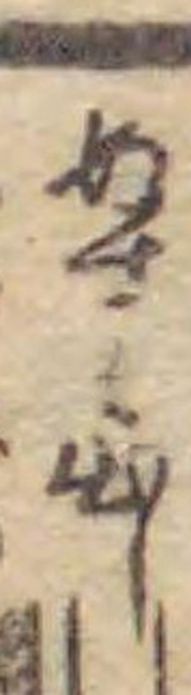ぬすみ出し
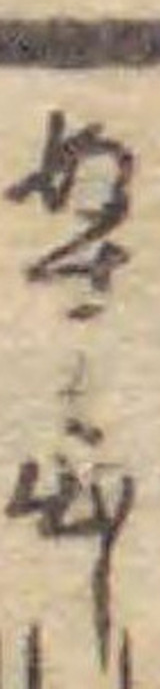ぬすみ出し
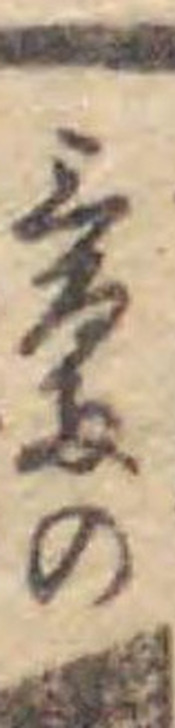三百両の
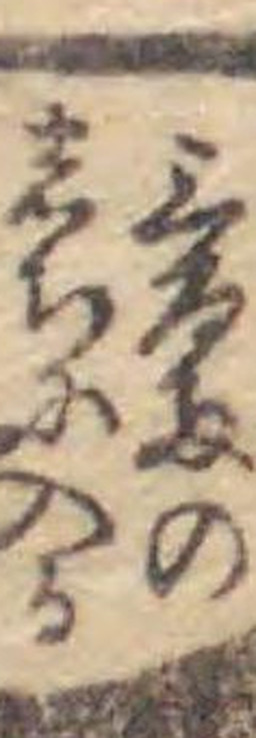しちに入る
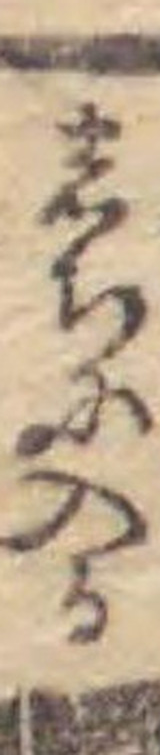しちに入る
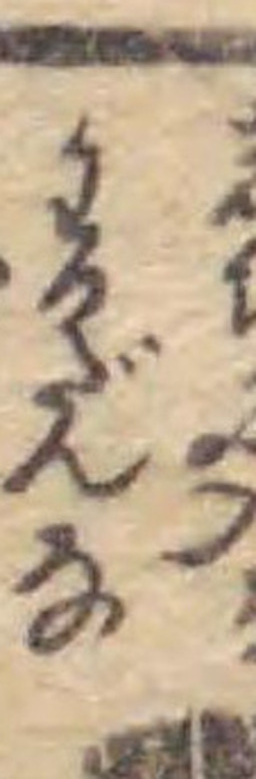わかだんな
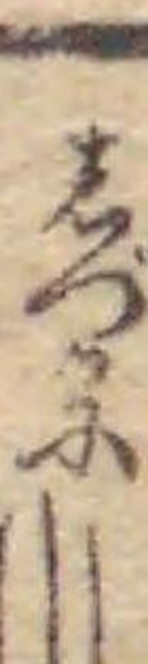しづかに
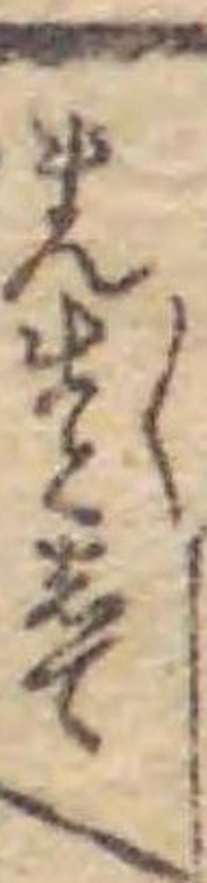まんまとして
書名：扨化狐通人 : 2巻
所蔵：国立国会図書館 National Diet Library, JAPAN
